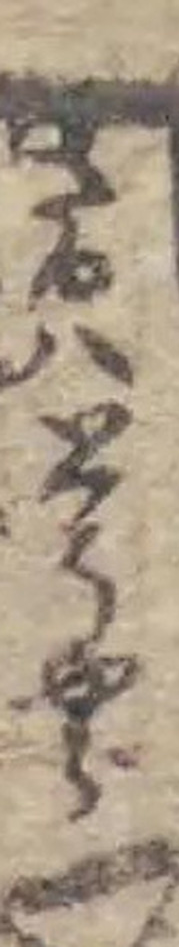さるはとうやら
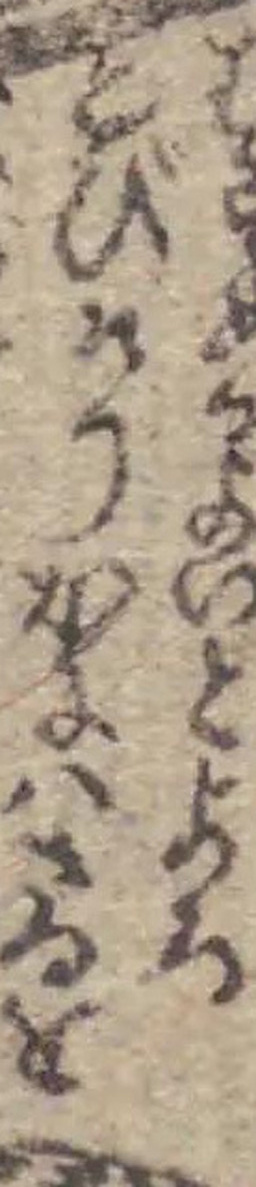こびけりかにはさるを
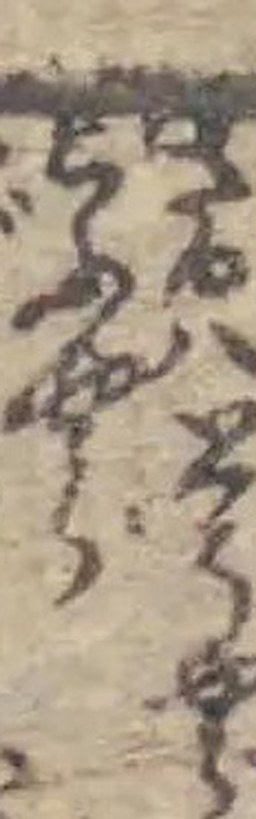こふやら
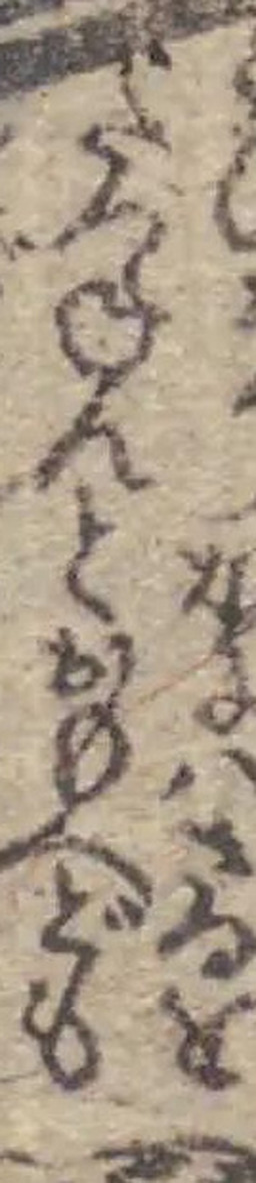たつねんとおもへども
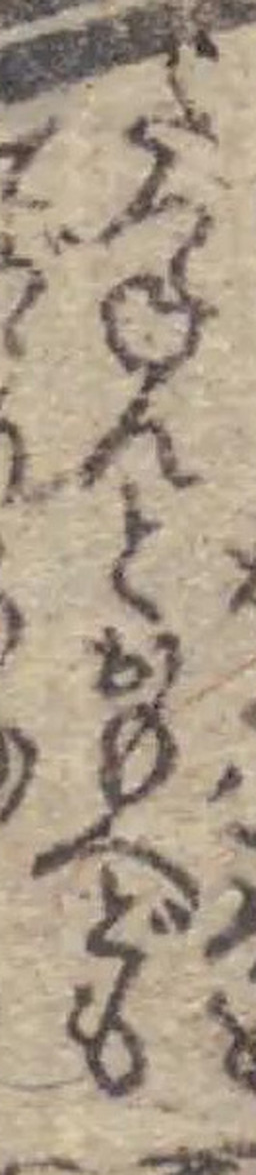たつねんとおもへども
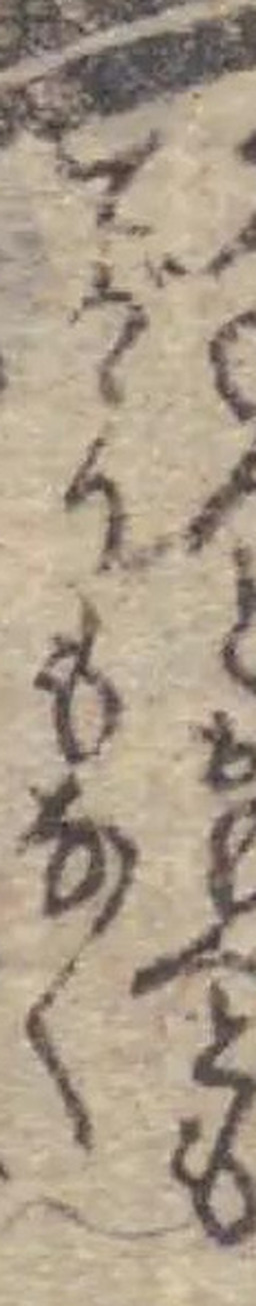てがゝりもなく
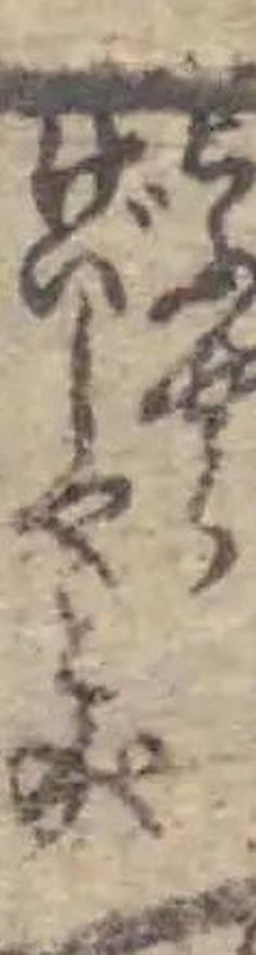げいしやと成
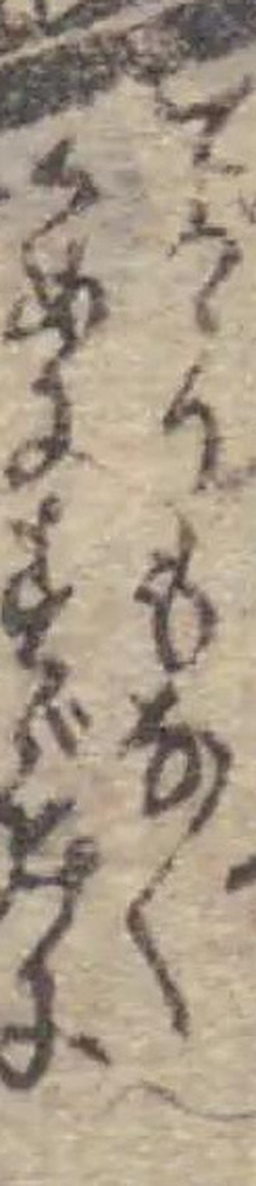かめにすゞみに
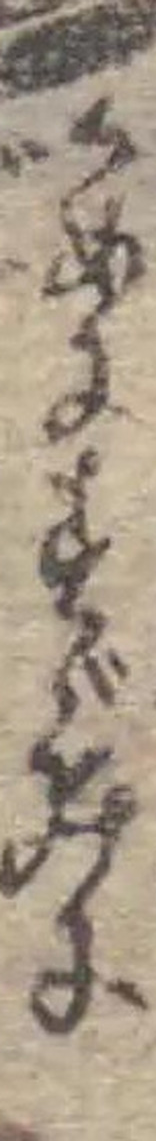かめにすゞみに
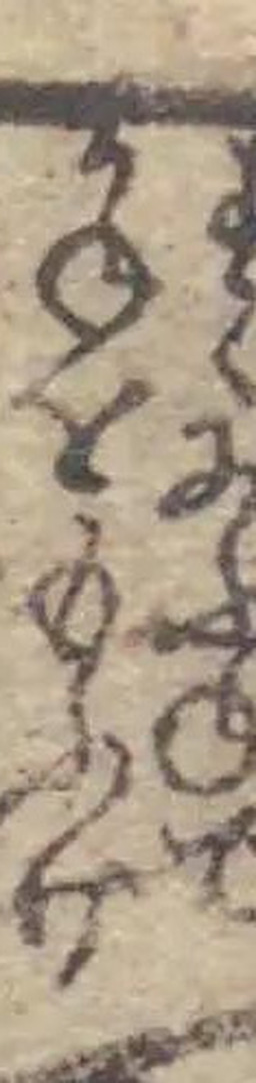かねをもふけ
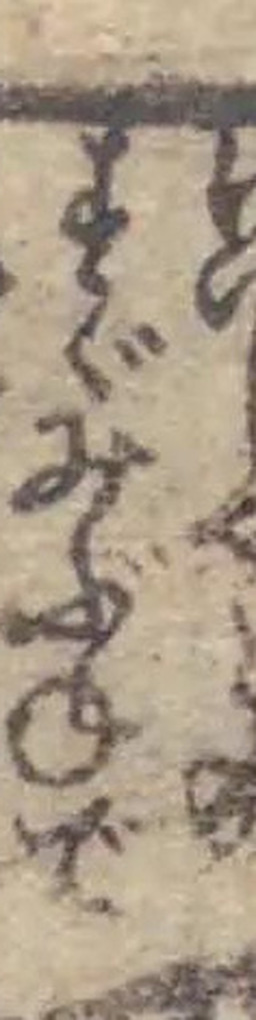すゞみぶねで
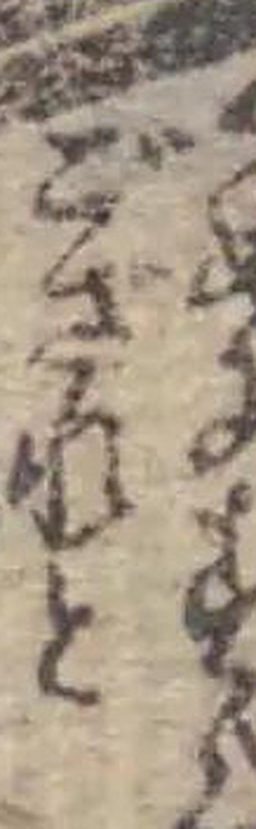ござれと
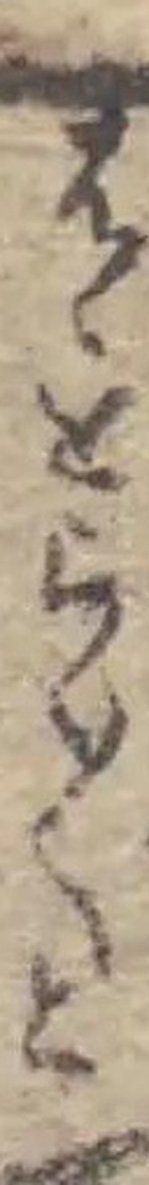はゝをらく〳〵と
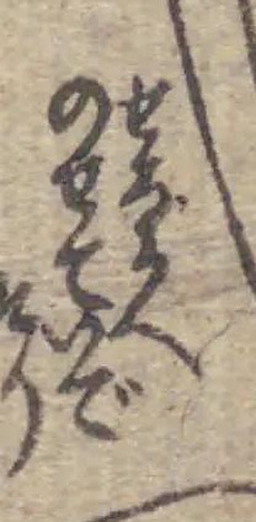のせていで
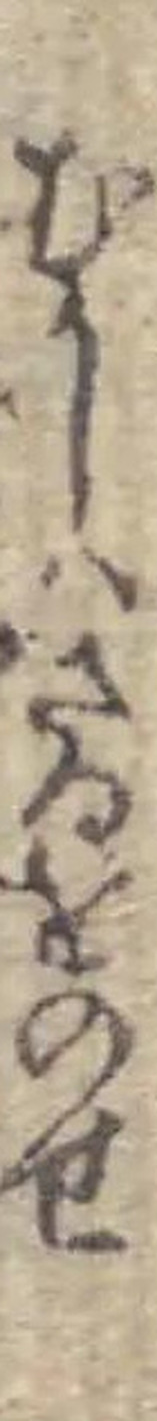むかしはさるをのせ
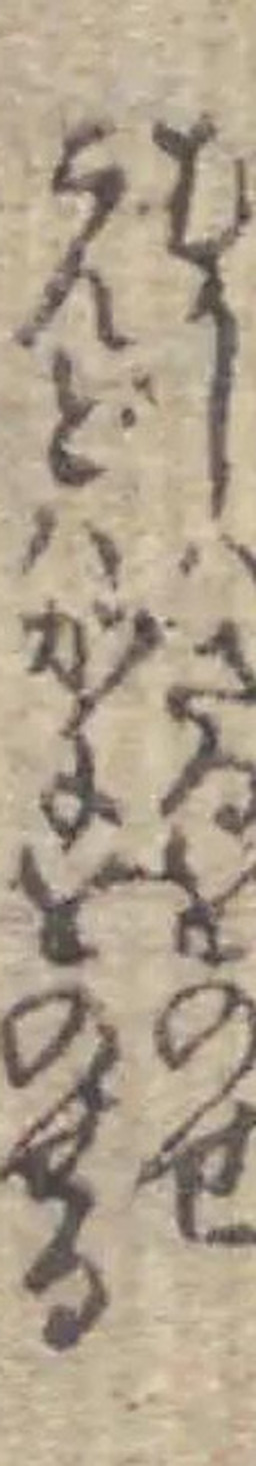こんどはかにをのせる
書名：蟹牛房挟多 3巻
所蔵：国立国会図書館 National Diet Library, JAPAN
